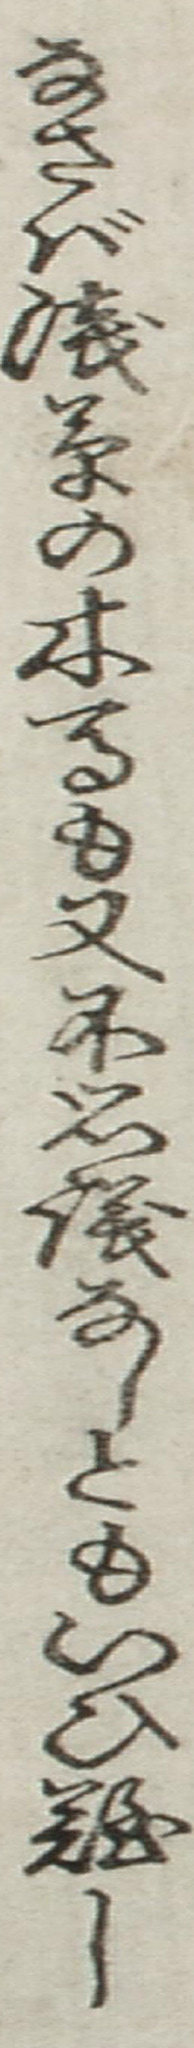なさば浅草の木馬も又不思議なしともいひ難し
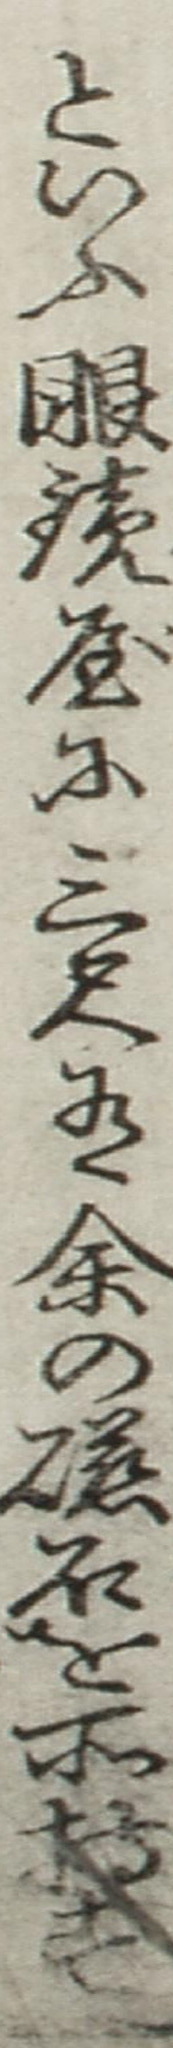といふ眼鏡屋に三尺有余の磁石を所持す
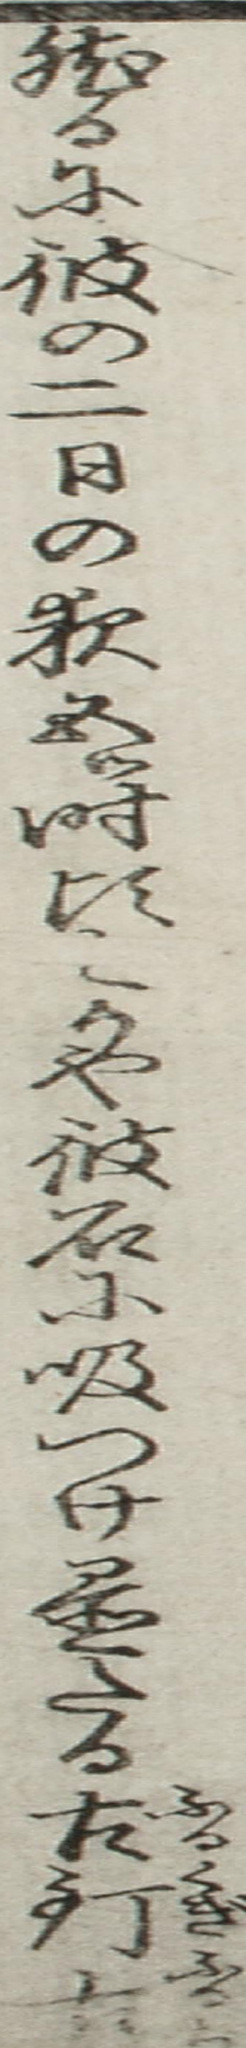然るに彼の二日の夜五ツ時頃とかや彼石に吸つけ置たる古釘古錠
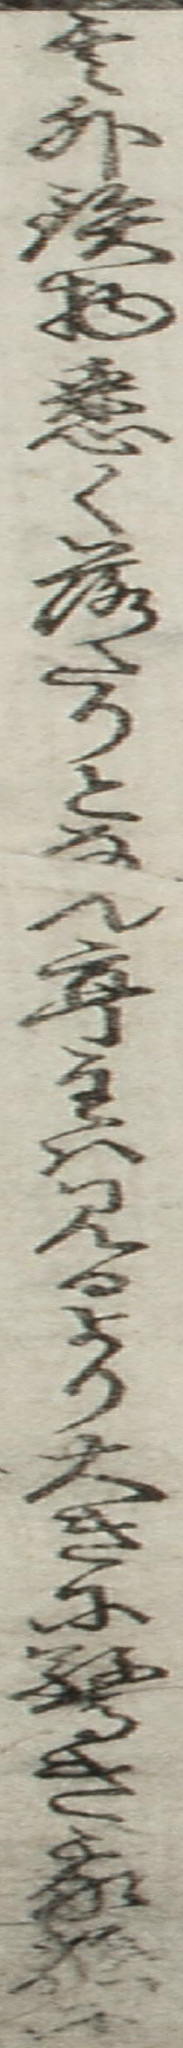其外鉄物悉く落たりとなん亭主は見るより大きに驚き我強に
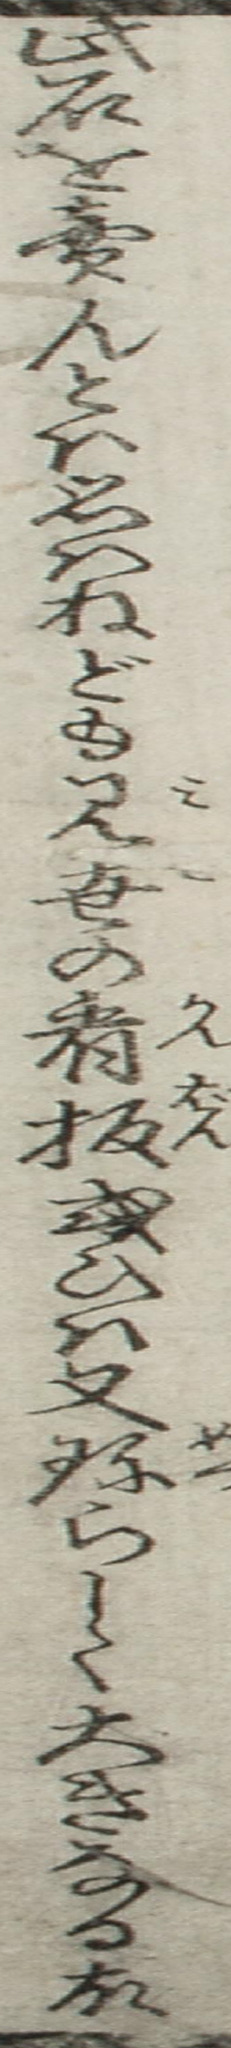此石を売んとは思はねども見世の看板或ひは又珍らしく大きなる故

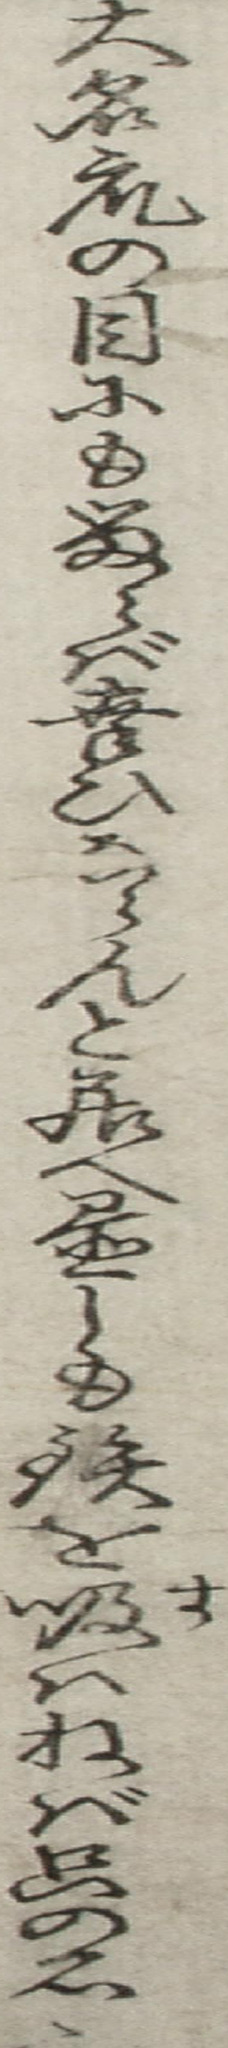大名衆の目にも留らば幸ひならんと居へ置しも鉄を吸はねば只の石也
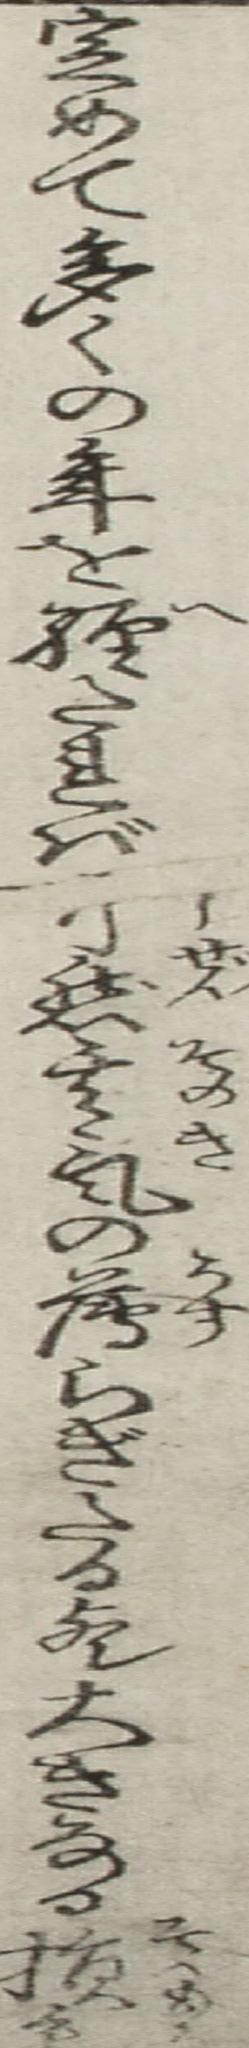定めて多くの年を経たれば自然其気の薄らぎたる歟大きなる損毛
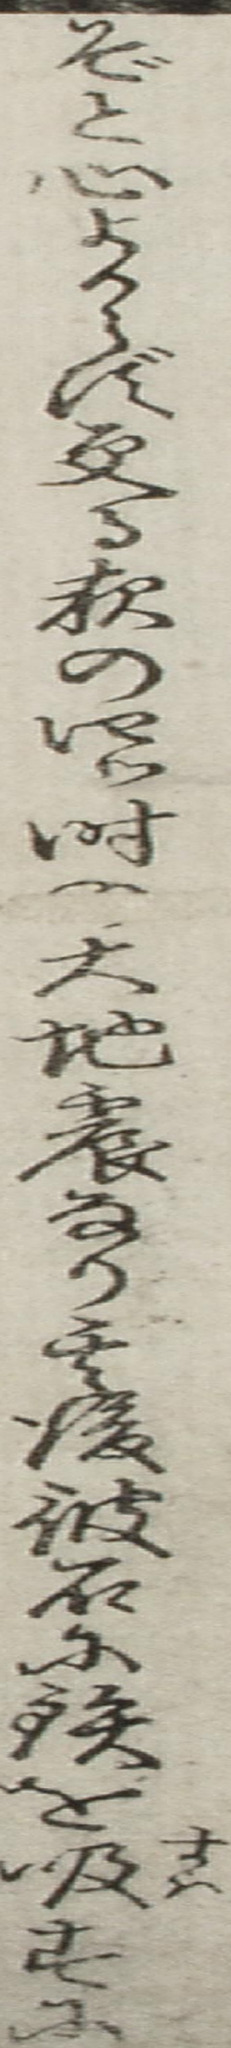ぞと心よからず更る夜の四ツ時の大地震なり其後彼石に鉄を吸すに
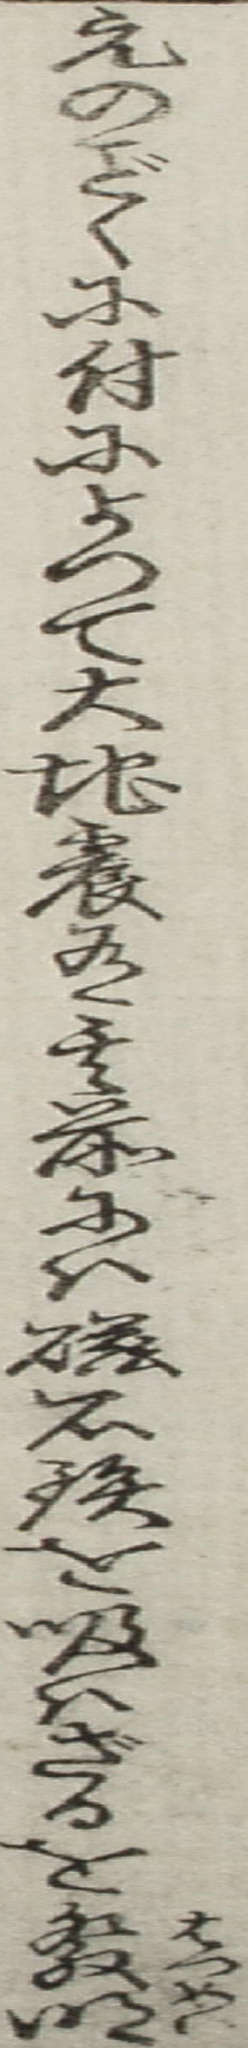元のごとくに付によつて大地震有其前には磁石鉄を吸はざるを発明
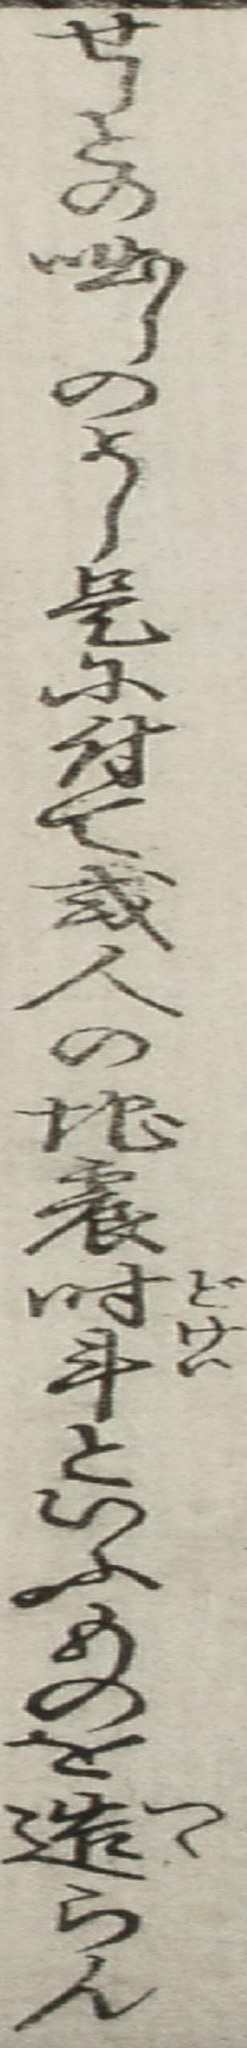せしとの咄しのよし是に付て或人の地震時計といふものを造らん
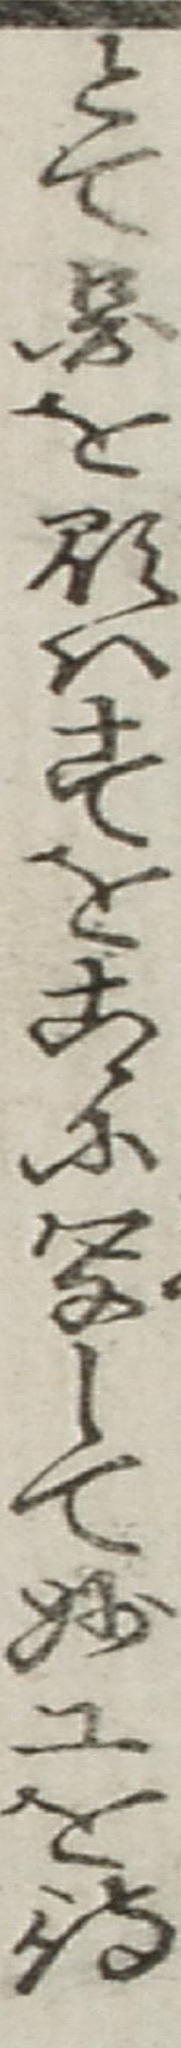とて図を顕はすをこゝに写して妙工を待
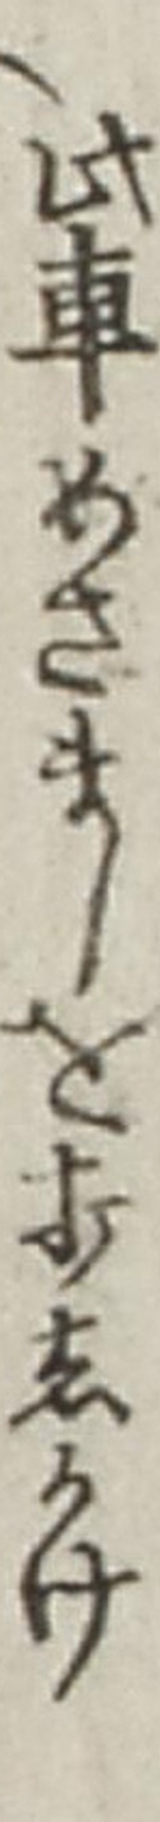此車めざましを打しかけ
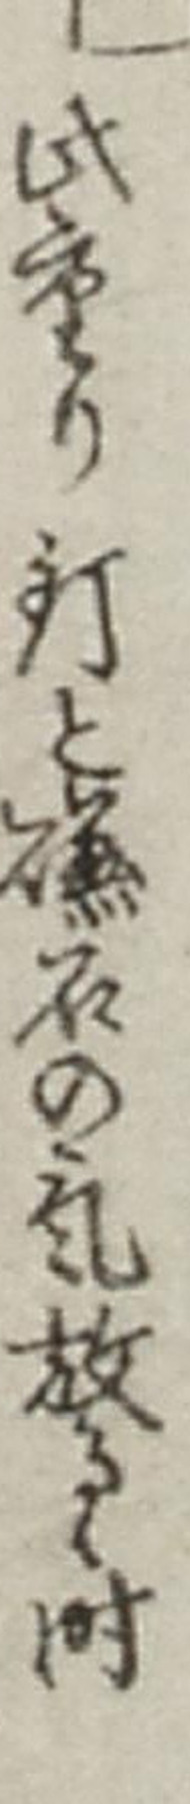此重り釘と磁石の気放るゝ時
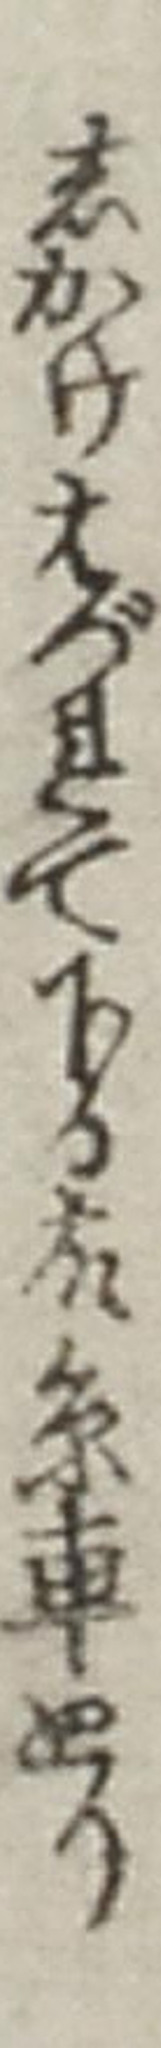しかけはづれて下る故糸車廻り
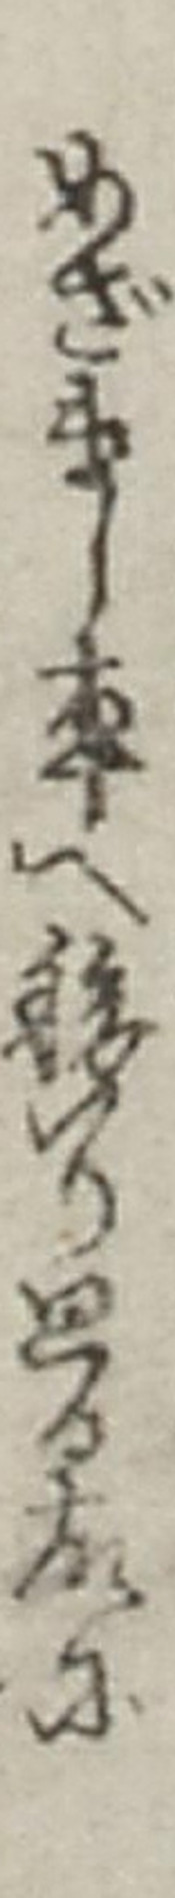めざまし車へ移り廻る故に
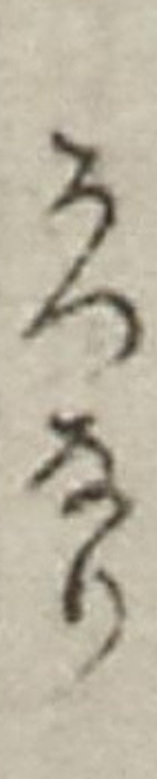うつなり
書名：安政見聞誌　下
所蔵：東京大学地震研究所図書室 Earthquake Research Institute Library, The University of Tokyo, JAPAN
